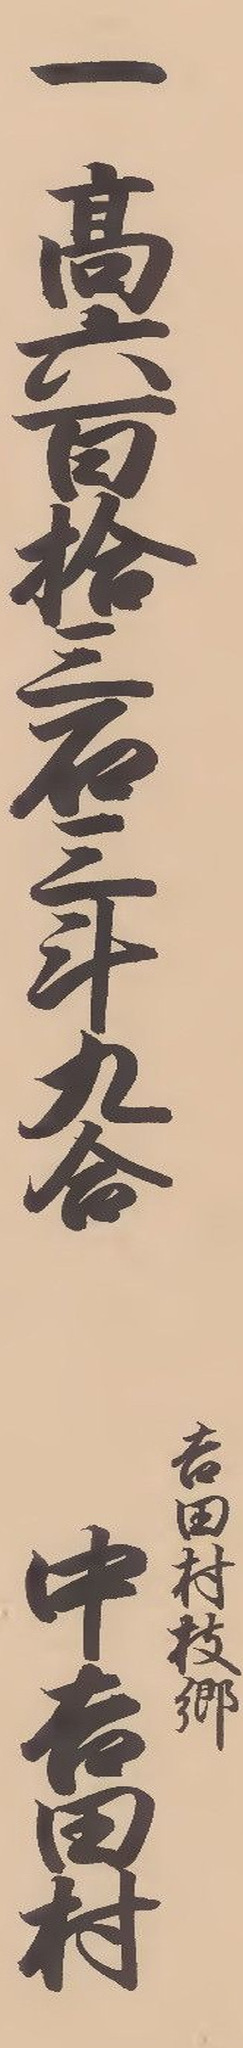一髙六百拾三石三斗九合中吉田村
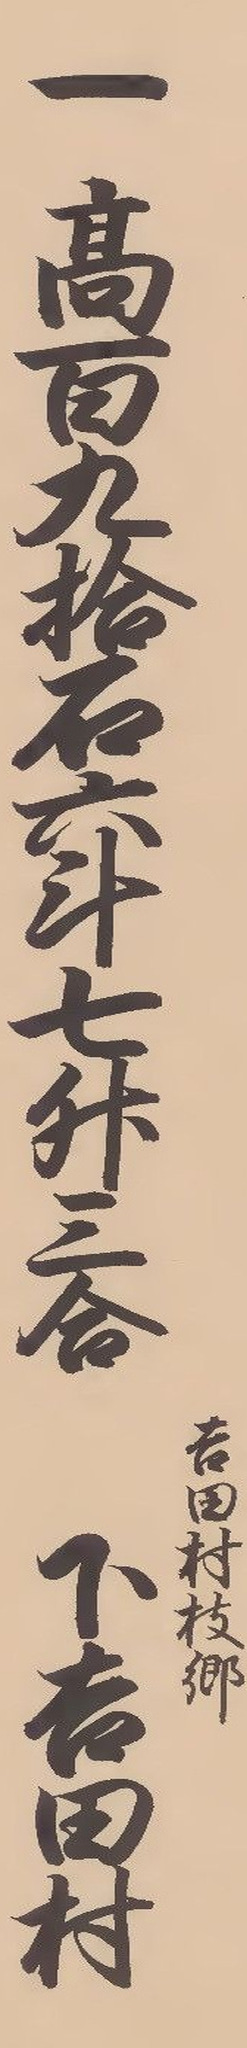一髙百九拾石六斗七升三合下吉田村
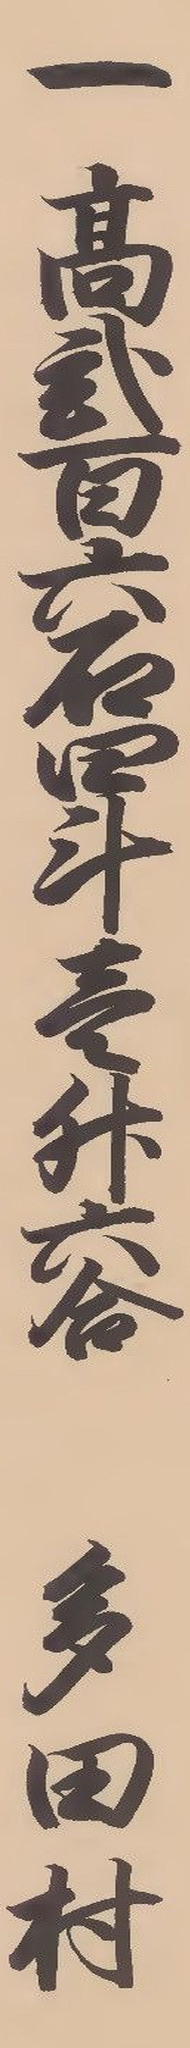一髙弐百六石四斗壱升六合多田村
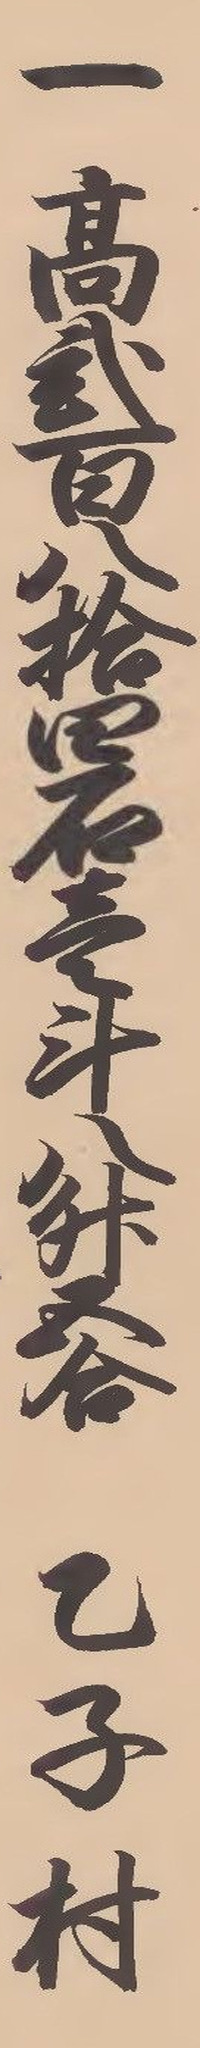一髙弐百八拾四石壱斗八升五合乙子村
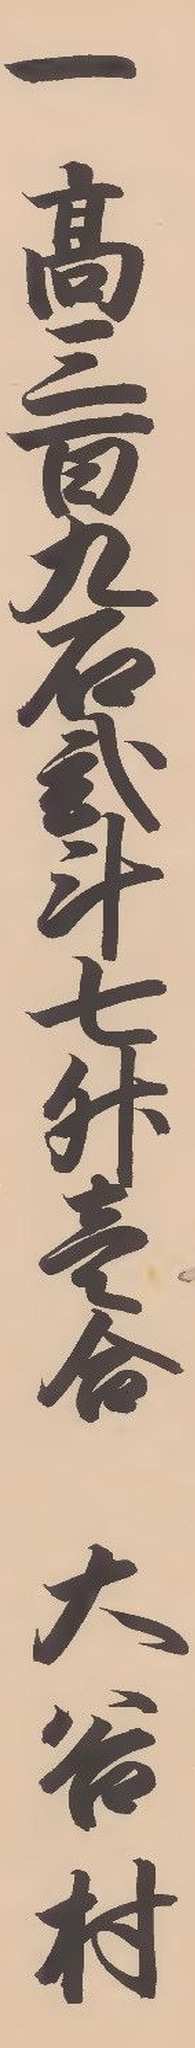一髙三百九石弐斗七升壱合大谷村
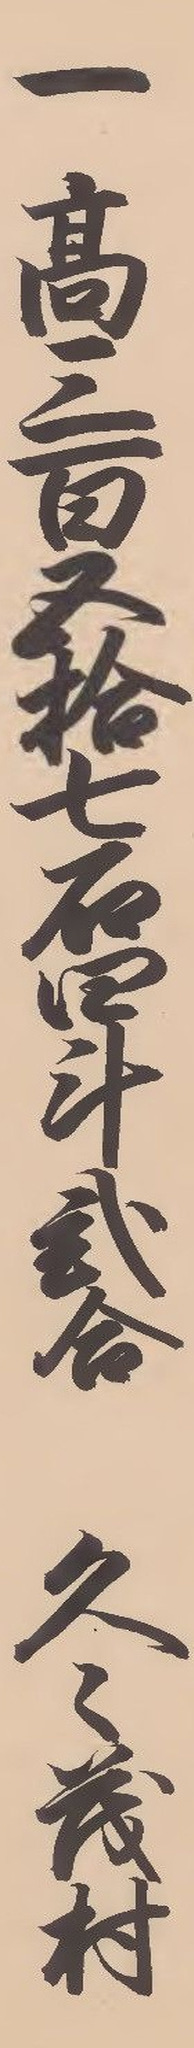一髙三百五拾七石四斗壱合久々茂村
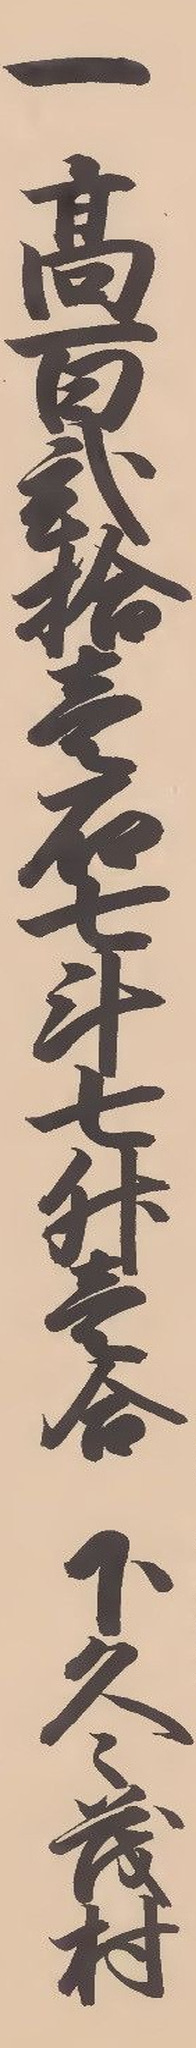一髙百弐拾壱石七斗七升壱合下久々茂村
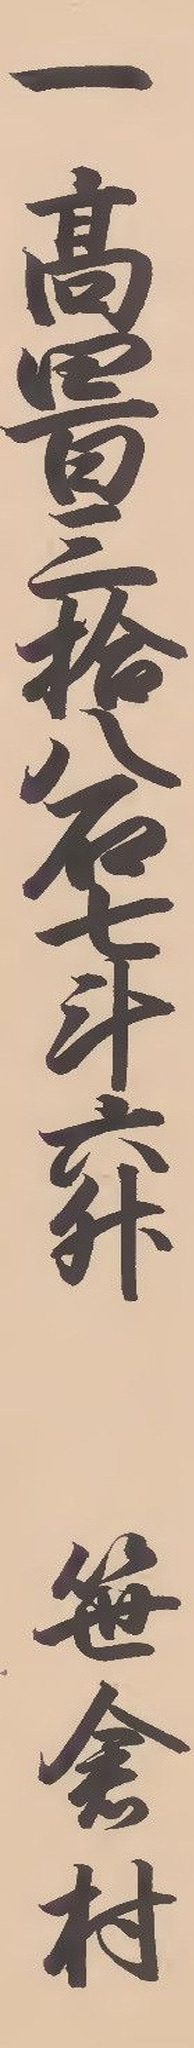一高四百三拾八石七斗六升笹倉村

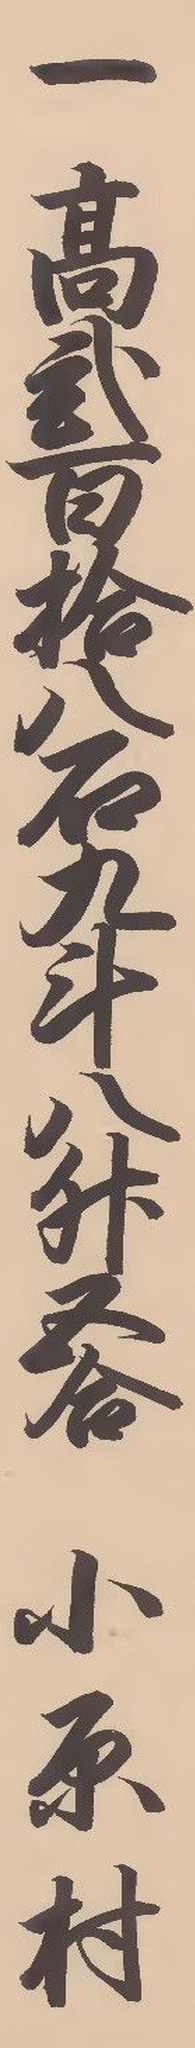一髙弐百拾八石九斗八升五合小原村
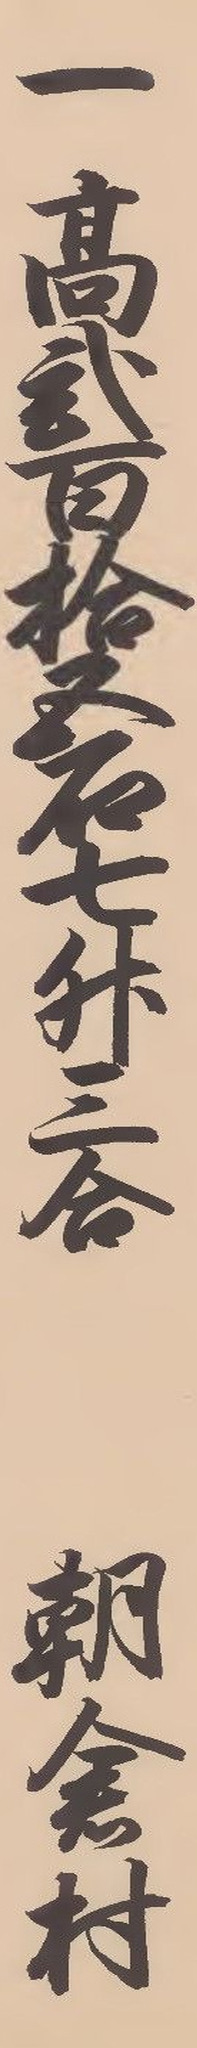一髙弐百拾五石七升三合朝倉村
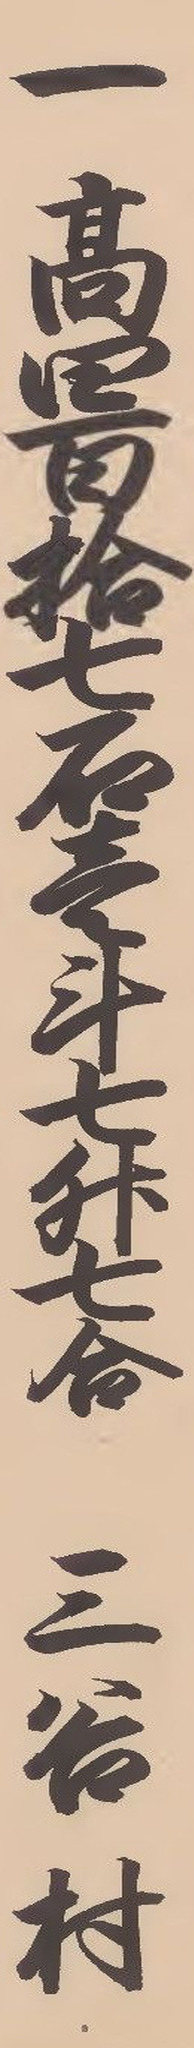一髙四百拾七石壱斗七升七合三谷村
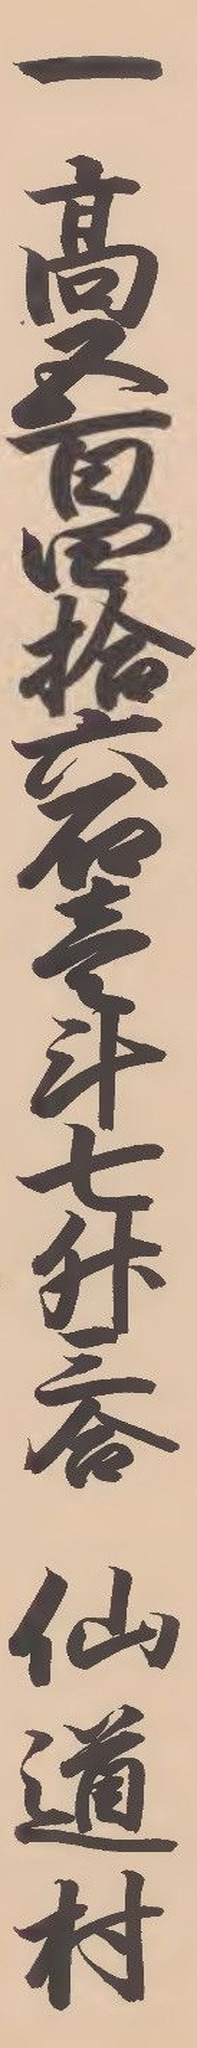一髙五百四拾六石壱斗七升三合仙道村
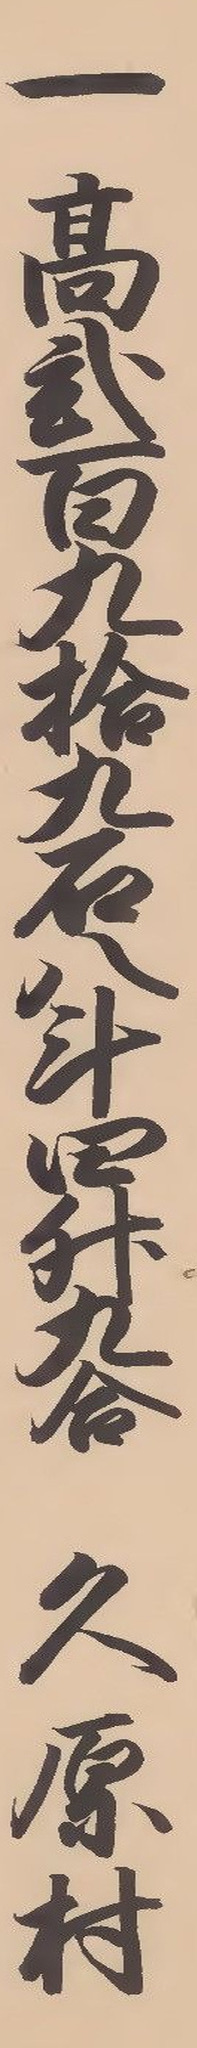一髙弐百九拾九石八斗四升九合久原村
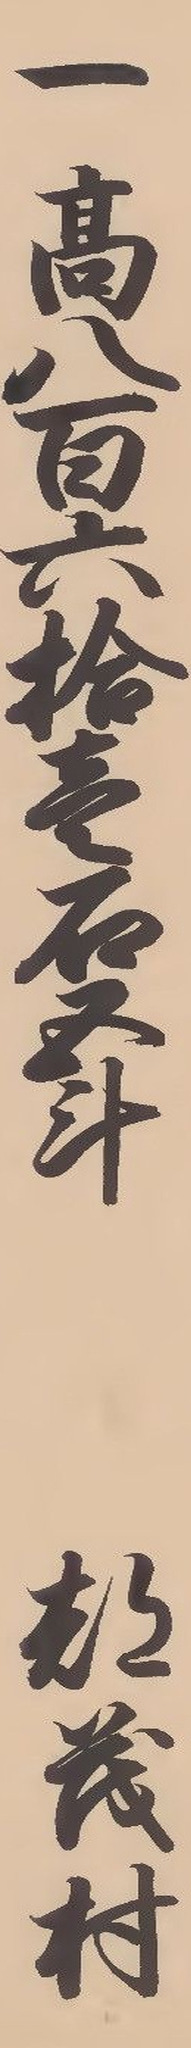一髙八百六拾壱石五斗都茂村
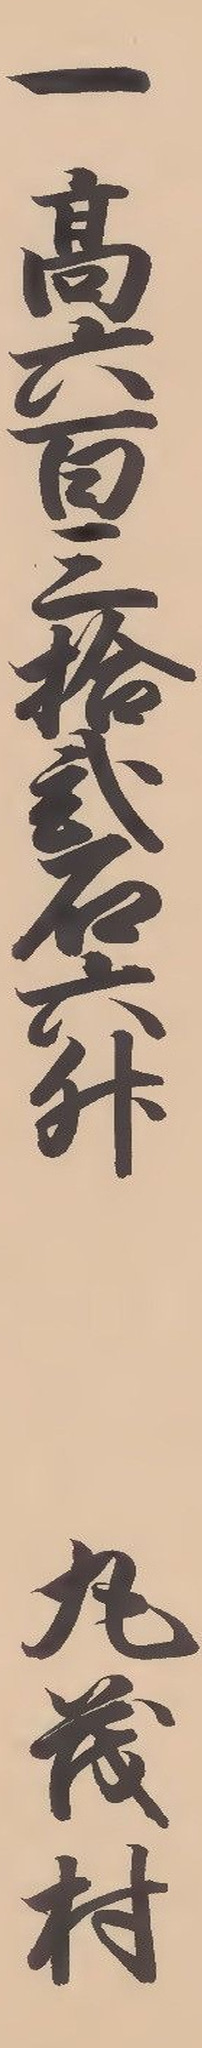一髙六百三拾弐石六升丸茂村
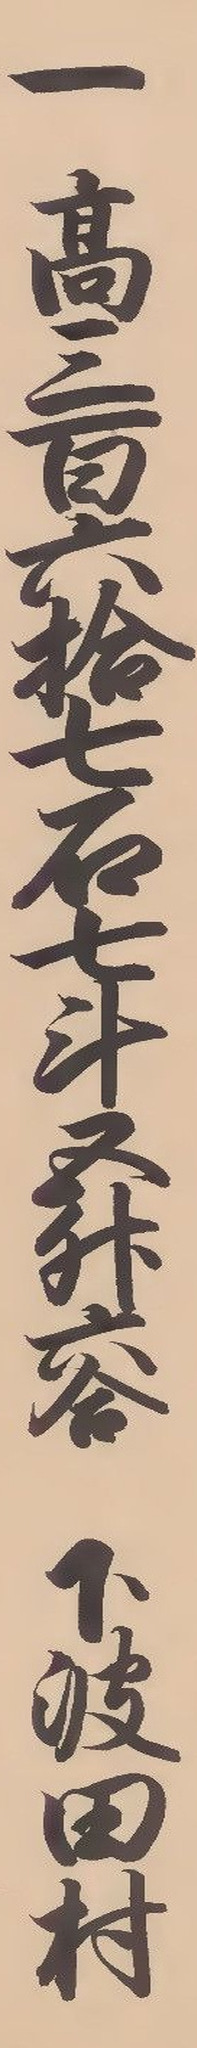一髙三百六拾七石七斗五升六合下波田村
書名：石見国郷帳
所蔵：国立公文書館 National Archives of Japan
